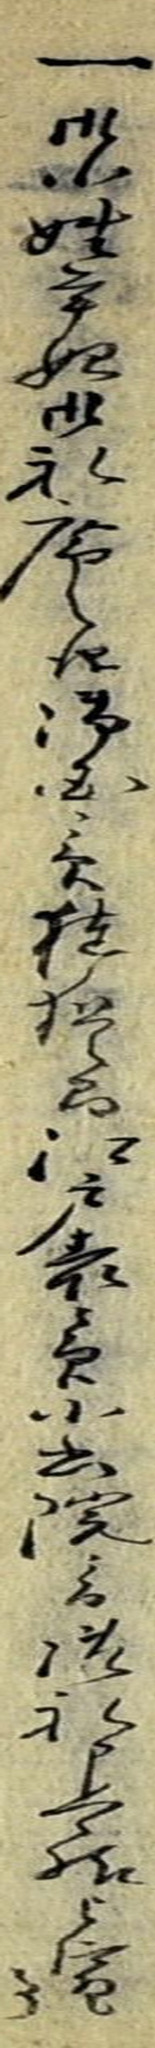一御小姓年始御礼席之儀御国ニ而ハ韃靼之間江戸表ニ而ハ小書院ニ而御礼申上候様被仰付候事
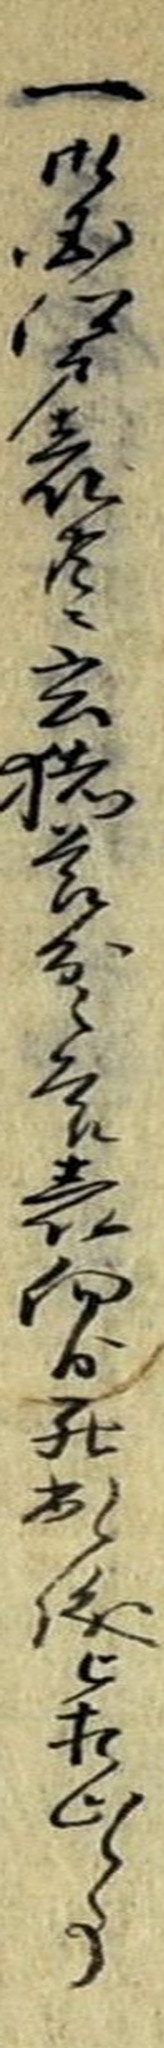一御国江戸表共ニ玄猪節分之節表向ゟ罷出候儀被相止候事
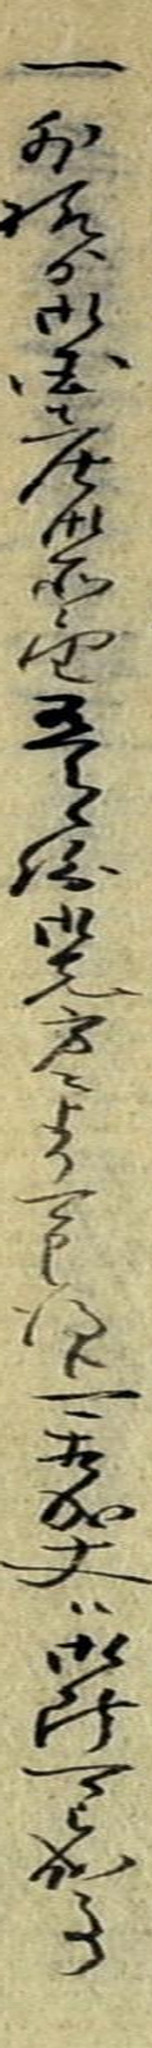一外様ゟ御国産御所望有之候儀御先方ニより可申候得ハ相成丈ハ御断可被成事
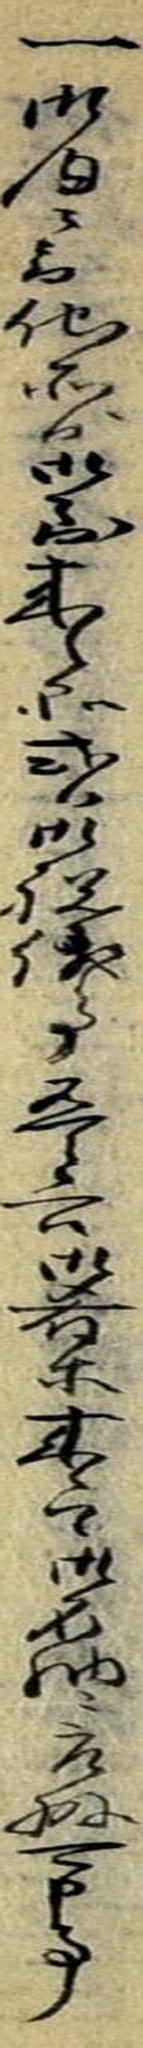一御内々ニ而他所ゟ御到来之品或ハ御祝儀事有之候ヘハ御肴等来候ハヽ御不納ニ取扱可申事
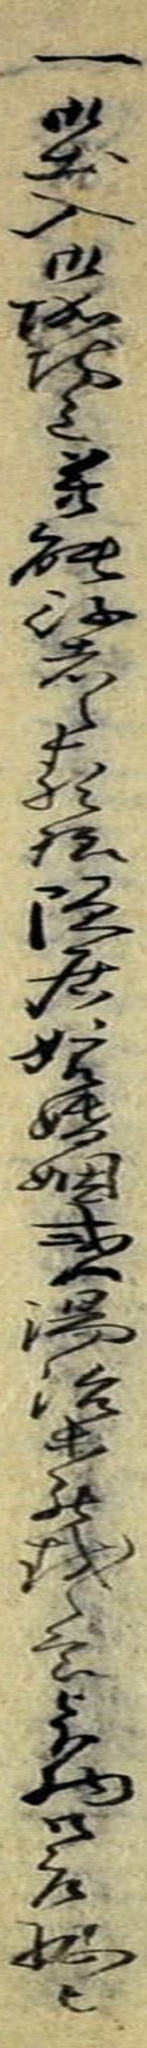一御出入御城坊主并能役者之類隠居娘婚姻或ハ湯治等罷越候節被下物御取扱被
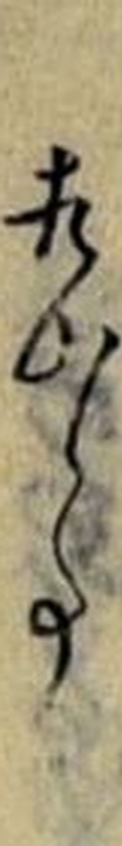相止候事
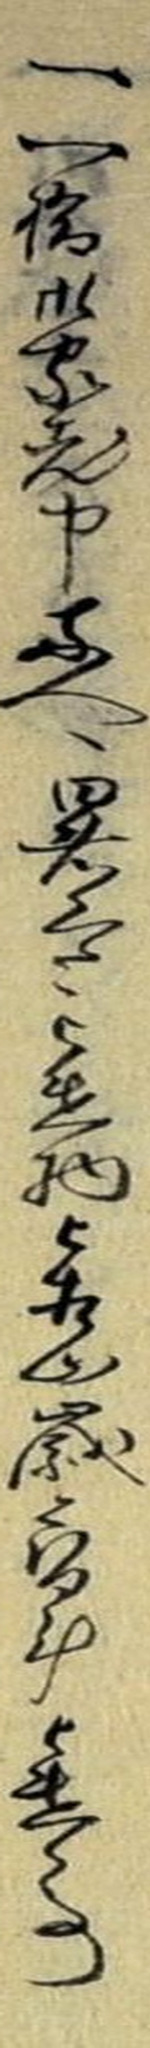一一橋御家老中両人へ暑寒被遣物被相止歳暮斗被遣候事
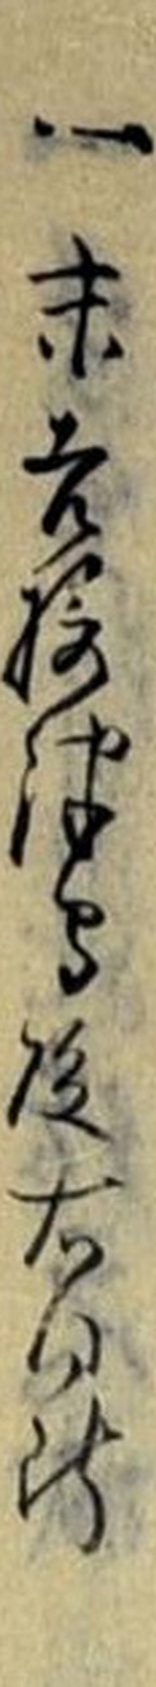一末吉摂津守殿右同断
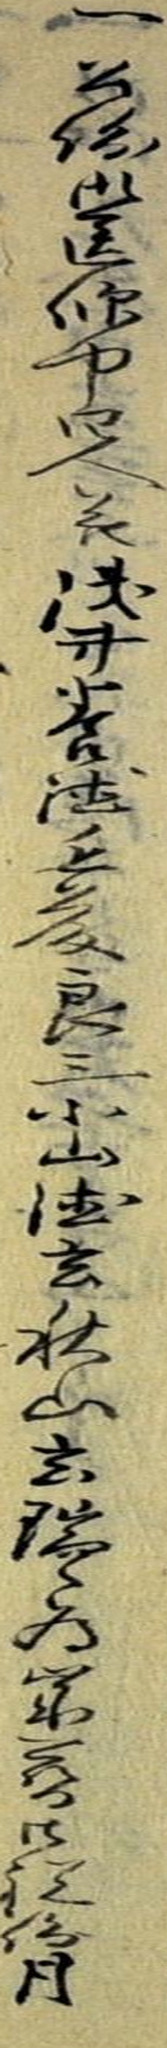一公儀御医師中四人并浅井養徳近藤良三小山徳玄秋山玄瑞へ為歳暮御祝儀月
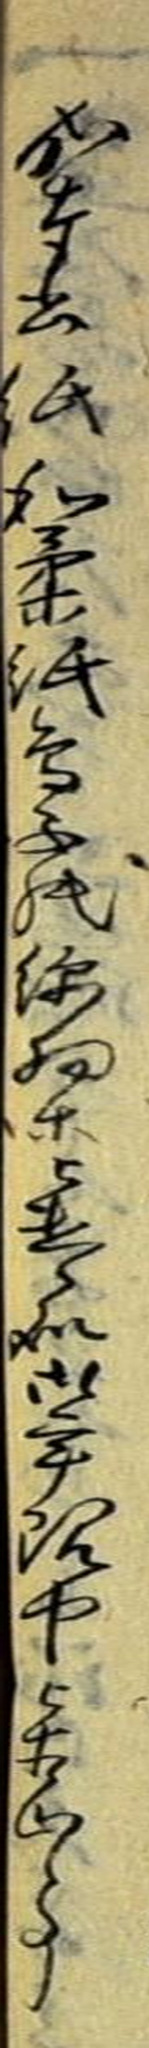成奉書紙和柔紙鳥子紙綿物等被遣候処御年限中被相止候事
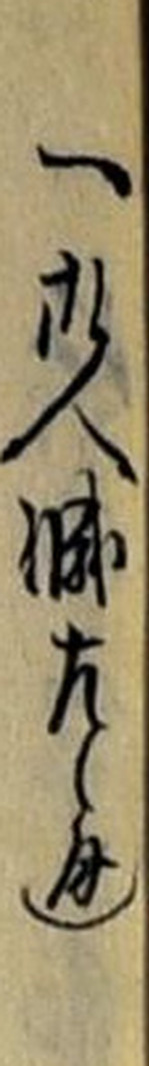一御人減左之通
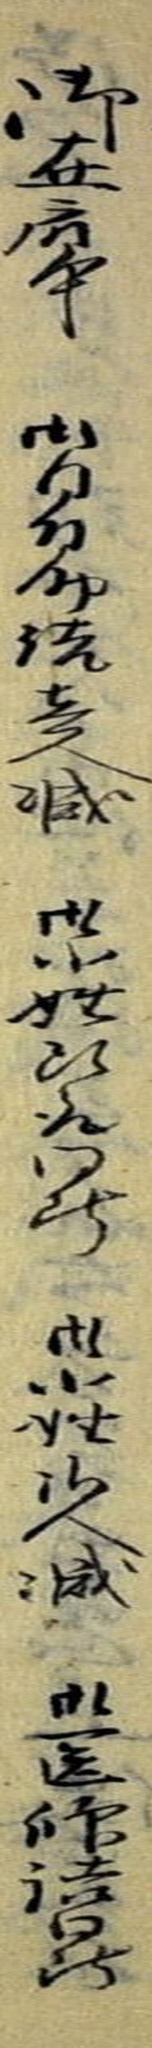御在府中御目付助詰壱人減御小姓頭取同断御小姓弐人減御医師詰同断
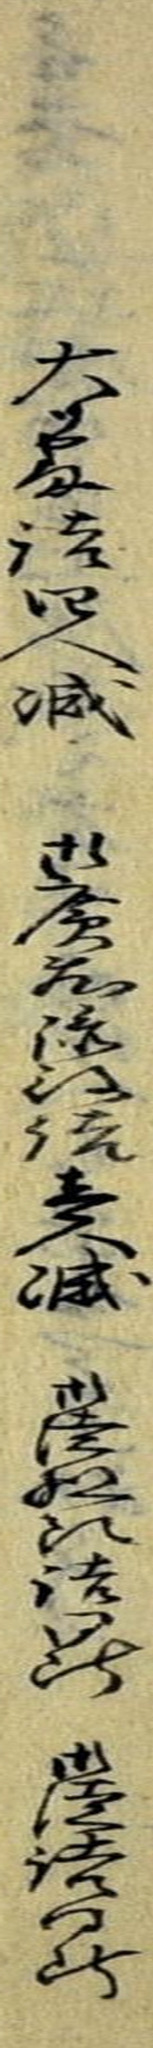大御番詰四人減御広敷添役詰壱人減御徒組頭詰同断御徒詰同断
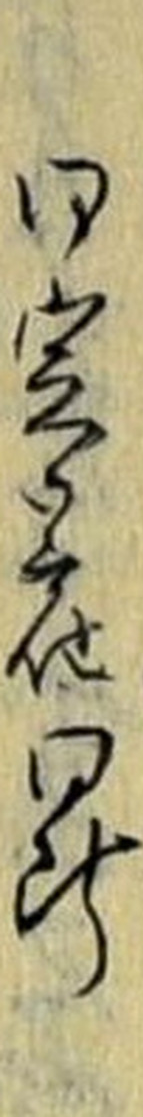同定御雇同断
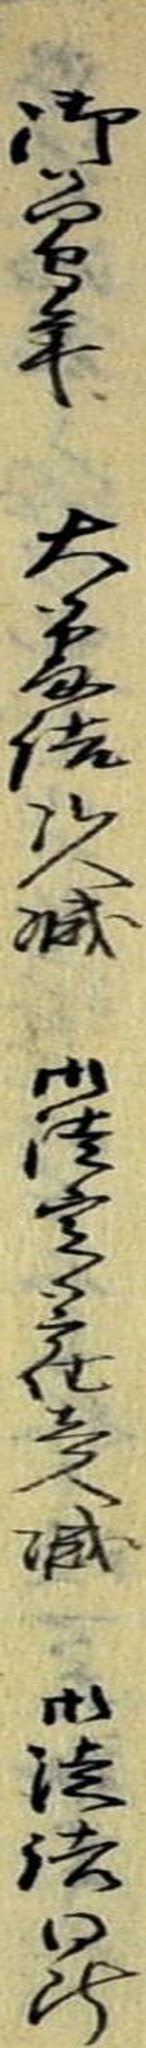御留守年大御番詰弐人減御徒定御雇壱人減御徒詰同断
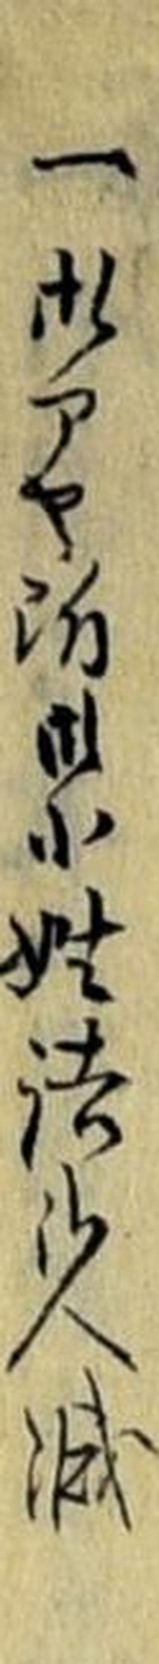一御部屋付御小姓詰弐人減
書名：命令之部 三
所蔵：福井県文書館 Fukui Prefectural Archives
